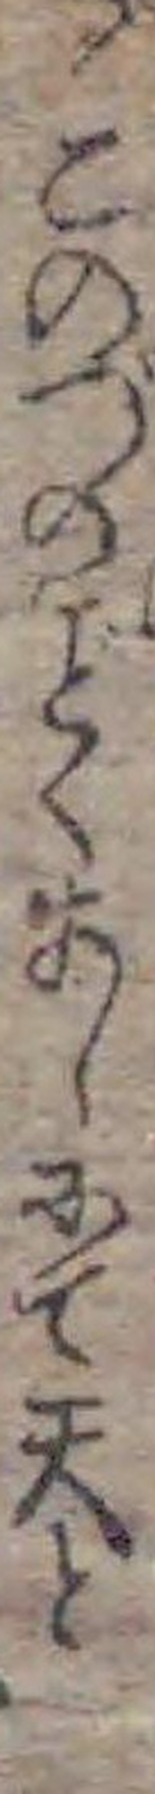このづのごとくあしにて天と
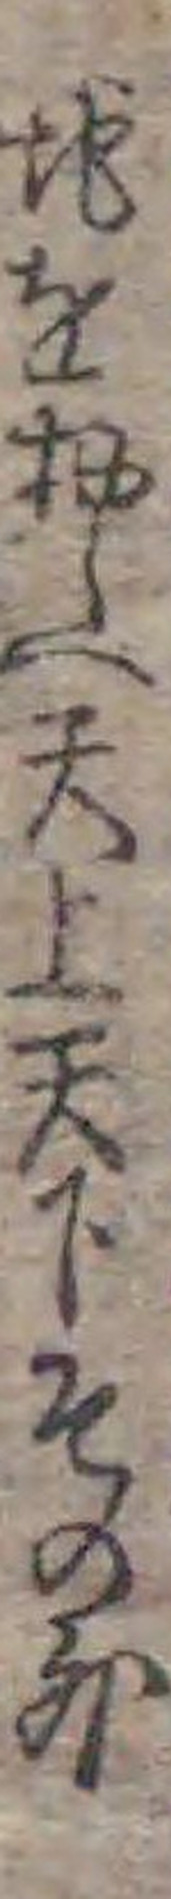地をおしへ天上天下その外
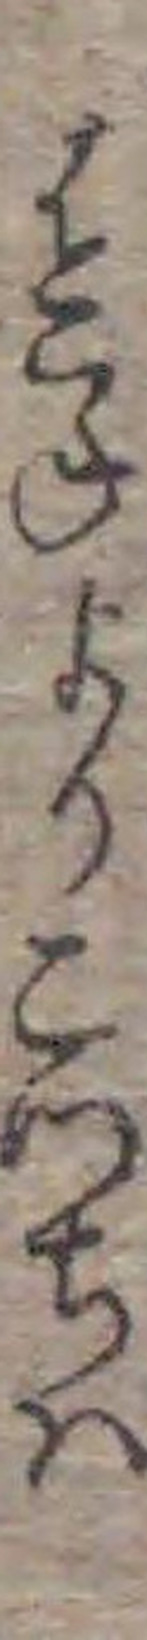はこねよりこつちは
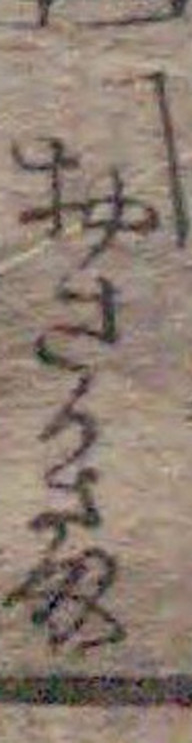〽おさかさま
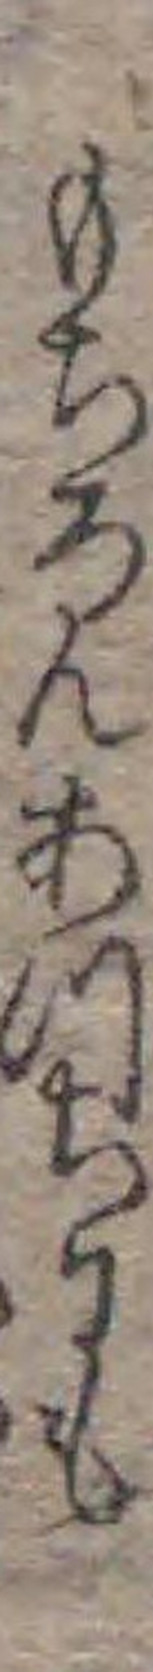もちろんあつちにも
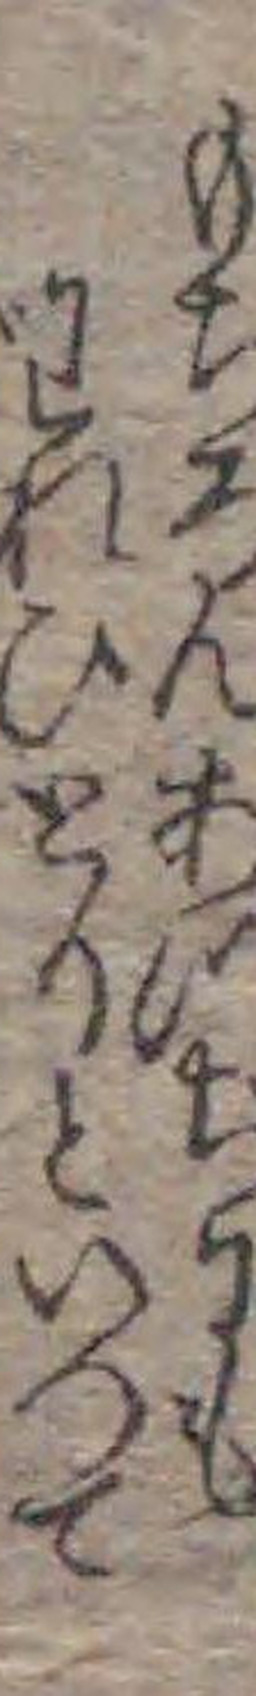われひとりといつて
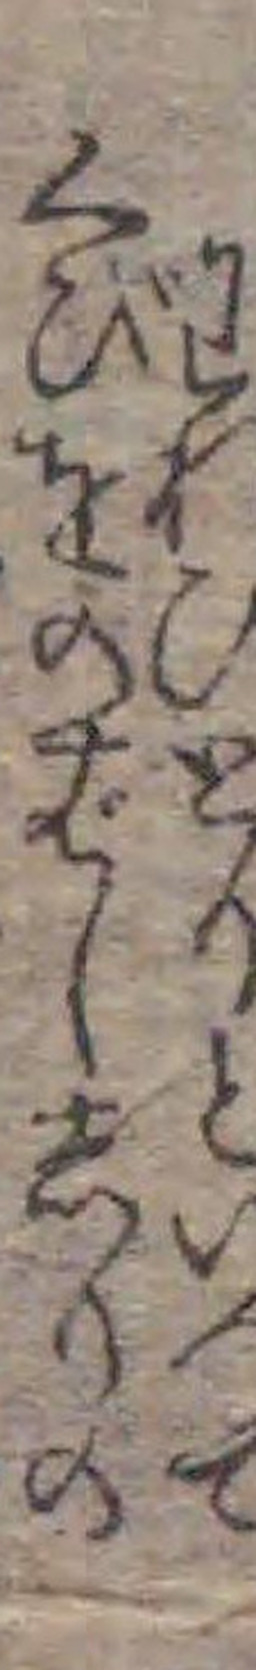くびをのばししりの
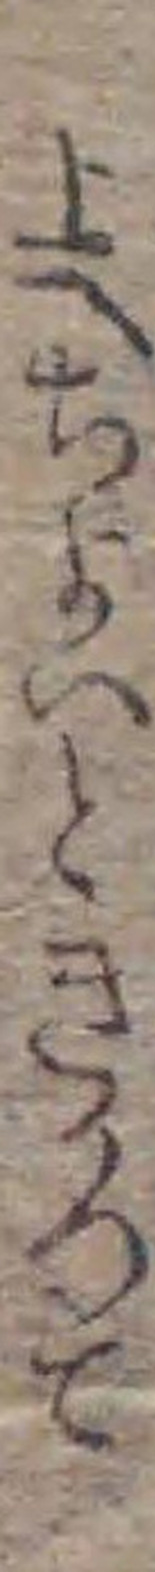上へちよいときかつて
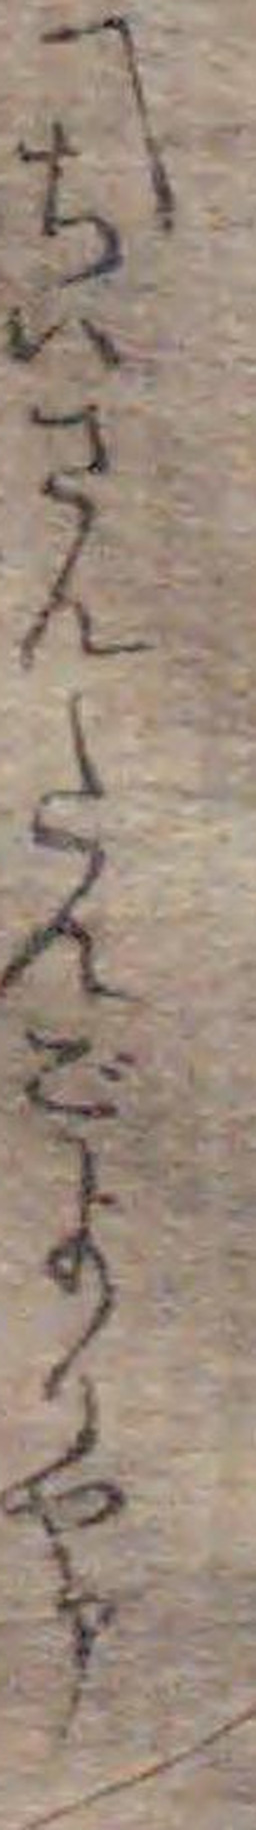〽ちいさんたんごよりやァ
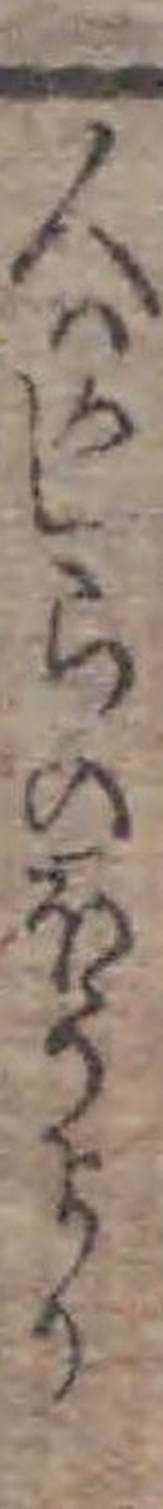人はかしらのほうより
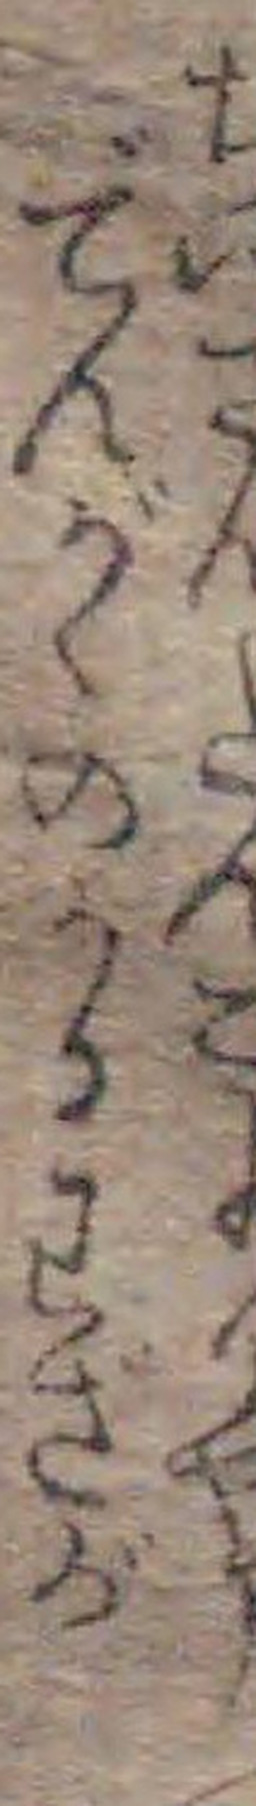でんがくのかるわざが
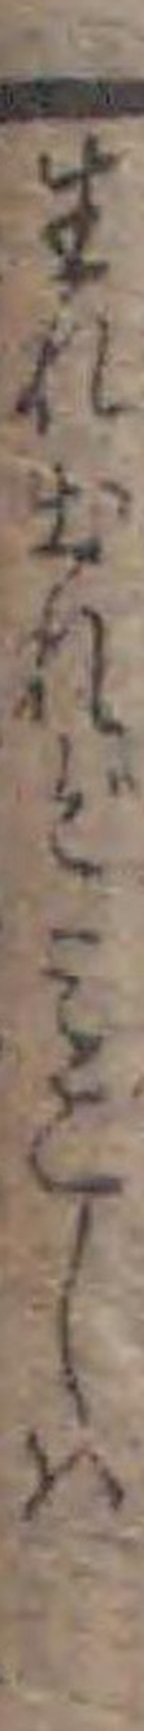生れ出れどみこしは
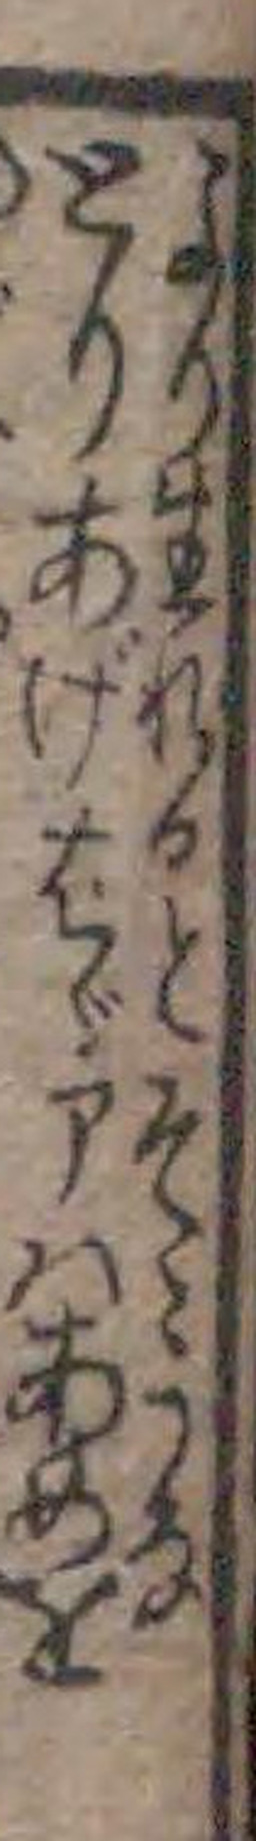とりあげばゞアはあめを
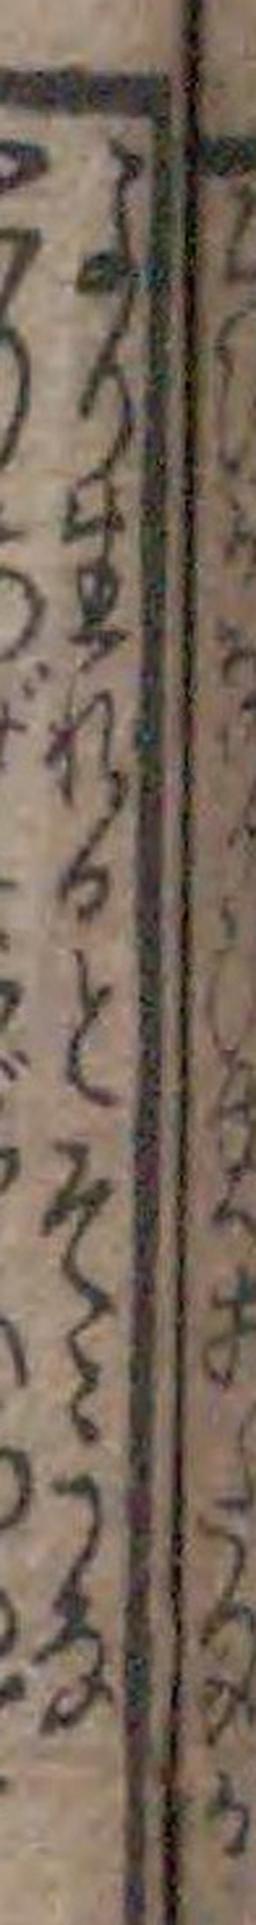より生れるとそゝうな
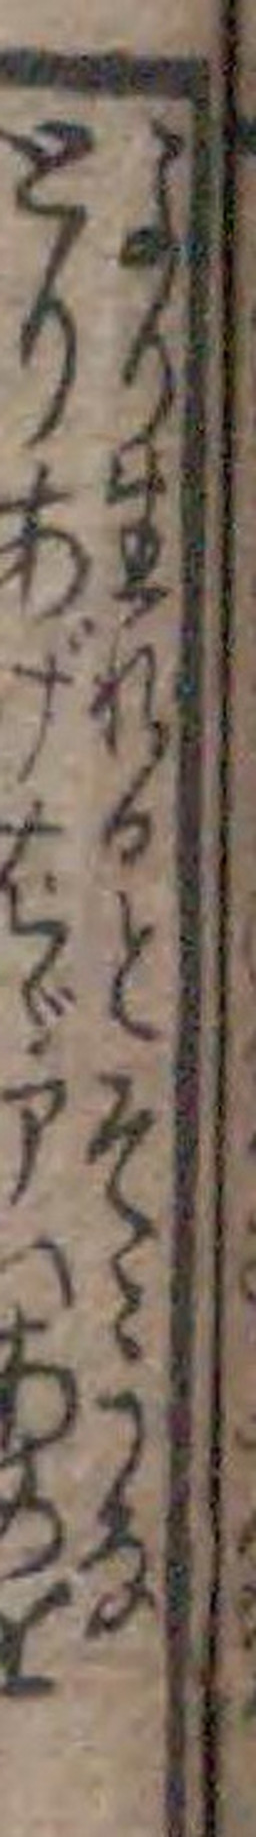とりあげばゞアはあめを
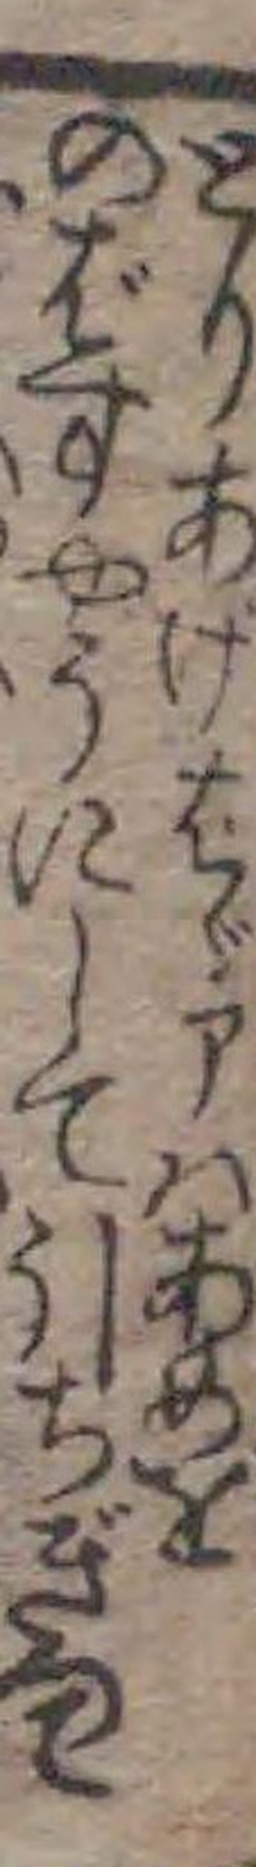のばすやうにして引ちぎつて
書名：年中行状記 : 2巻
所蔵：国立国会図書館 National Diet Library, JAPAN
